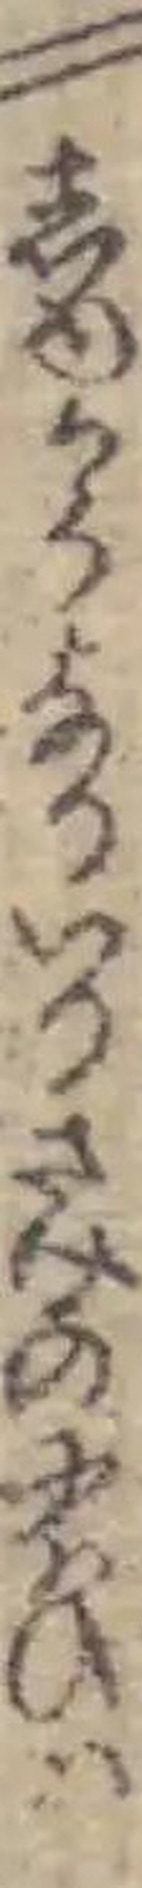しゆかうなりいりさけのにほひは
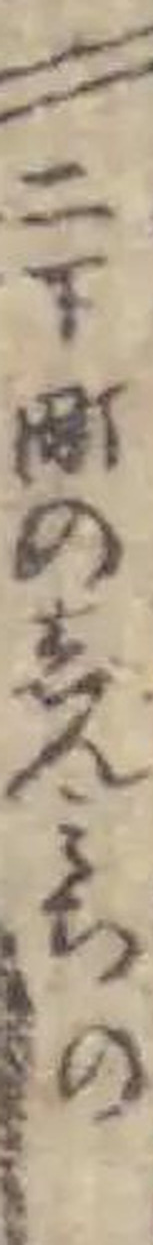二町のしんみちの
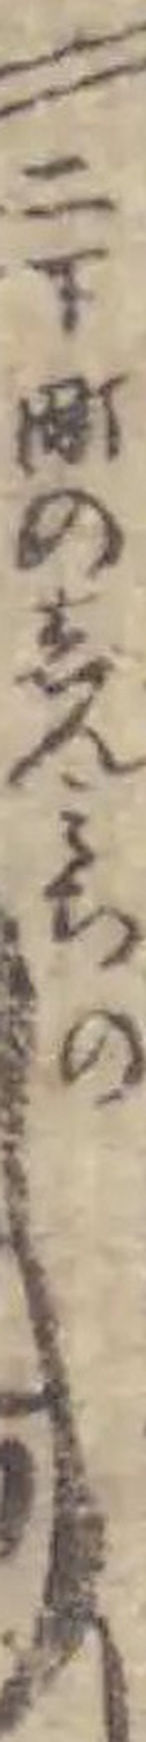二町のしんみちの
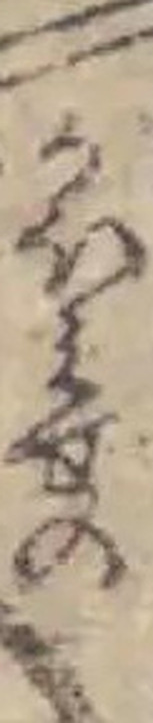かほみせの
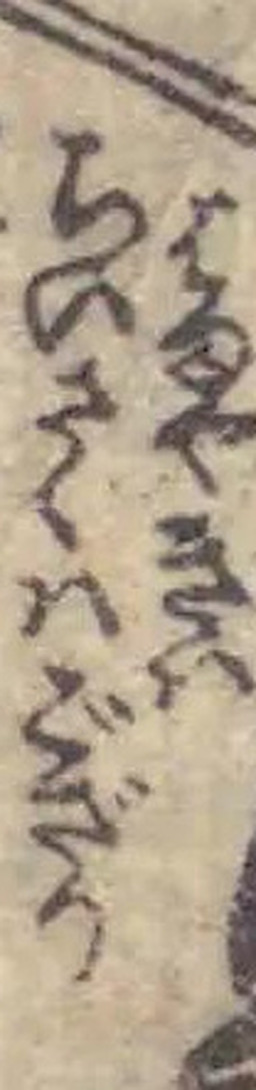ちいさくはぼざり
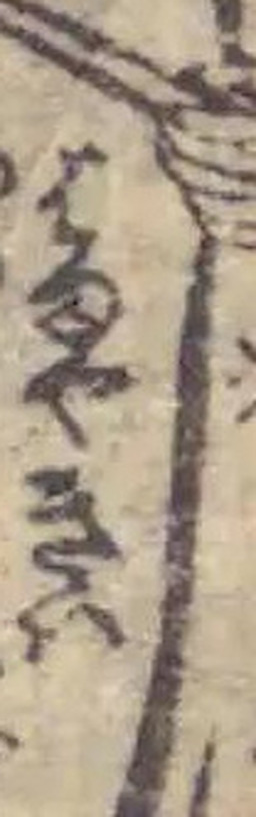はまやきは
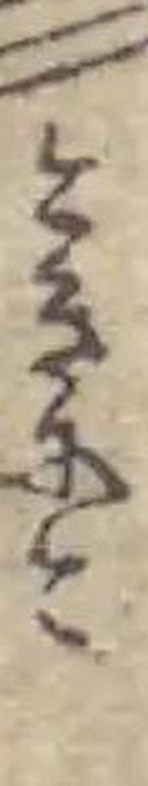ときにこ
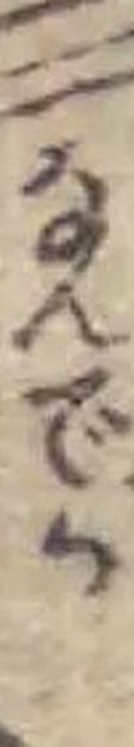なんでか
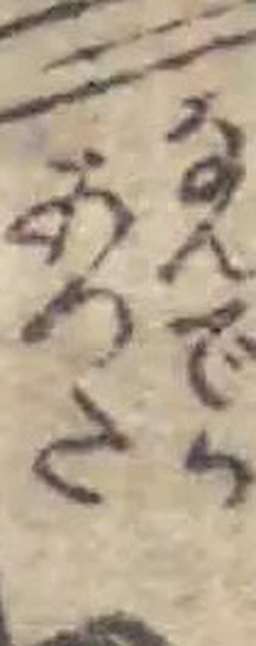あつた
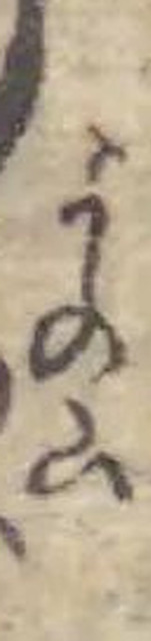よしの山
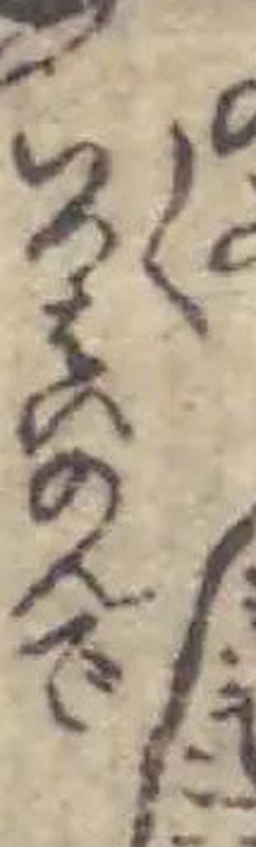いつはいのんで
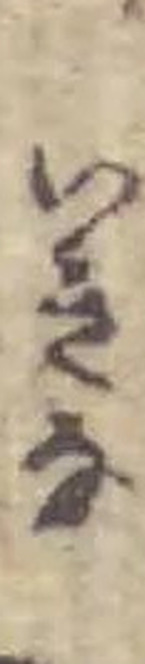いきな
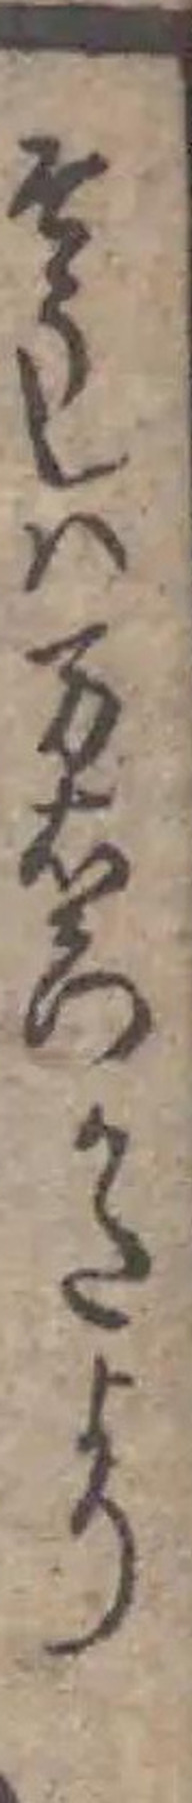そうしは万右衛門かたより
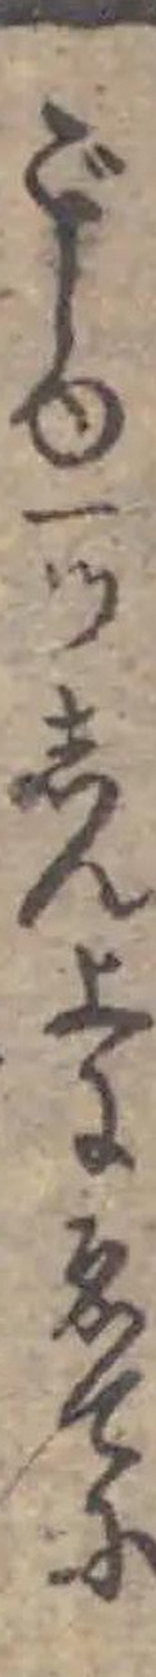ごしゆ一つしん上にゑてに
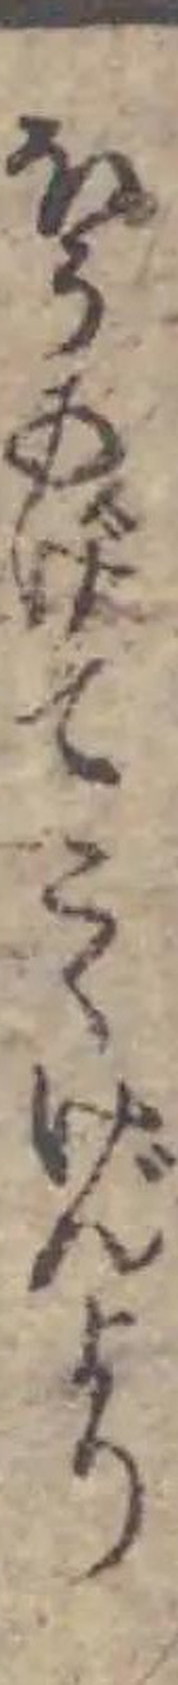ほうあげてこくげんより
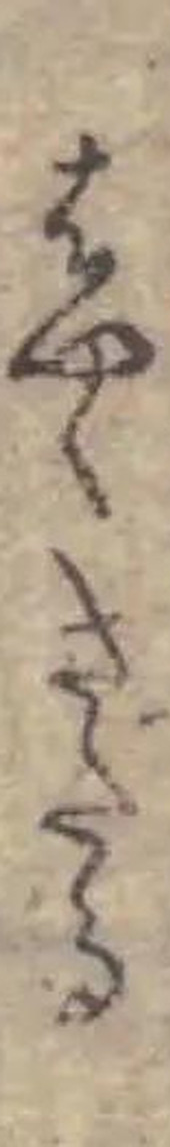はやくきたる
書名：飲中八人前 3巻
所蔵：国立国会図書館 National Diet Library, JAPAN
